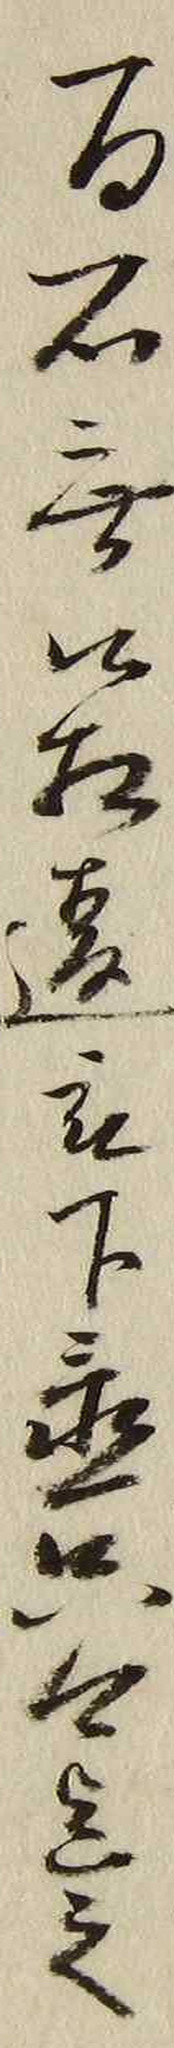百石無御相違被下置只今迄之
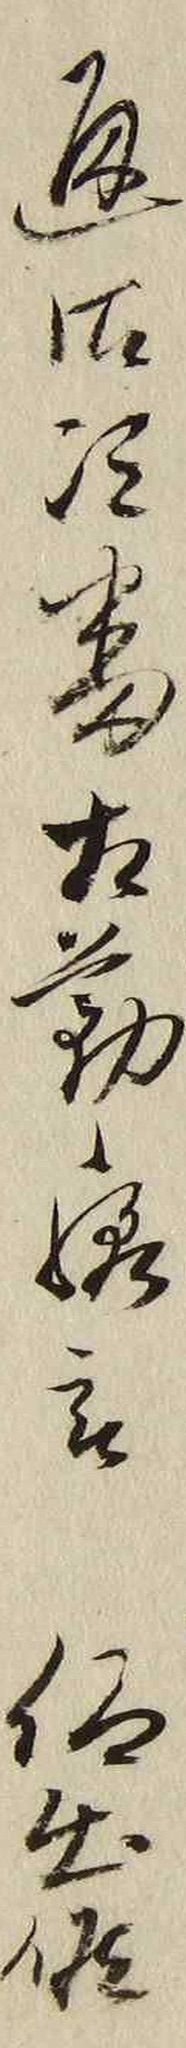通御次番相勤候様被仰出候

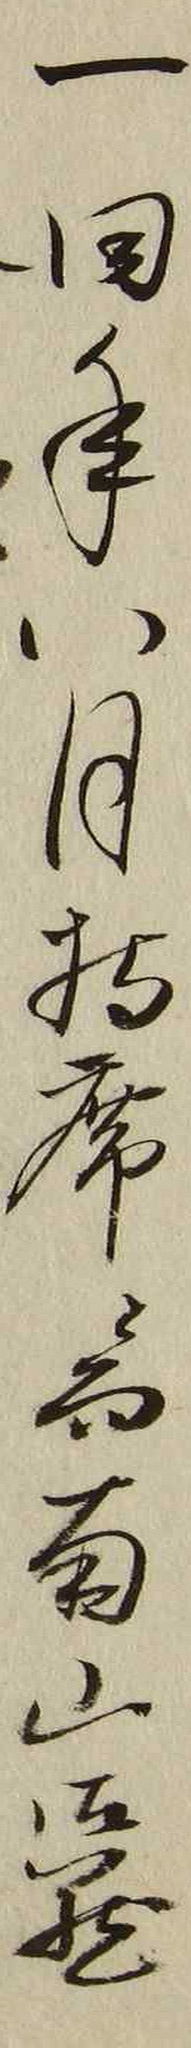一同年八月持席ニ而南山御蔵
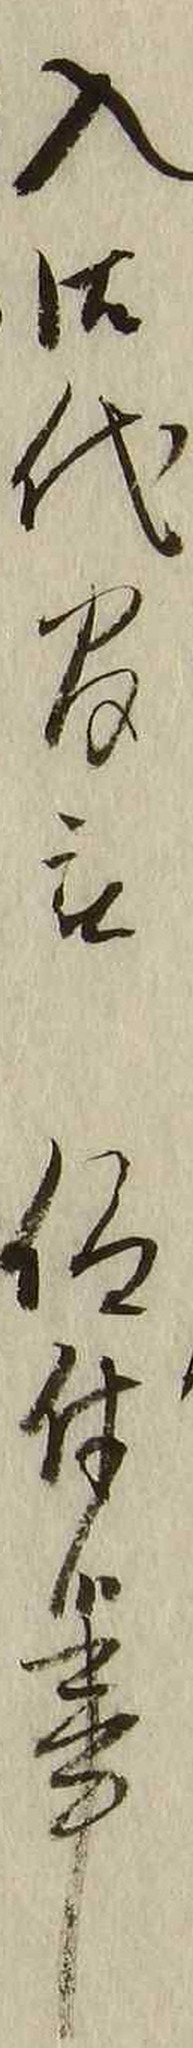入御代官被仰付候事
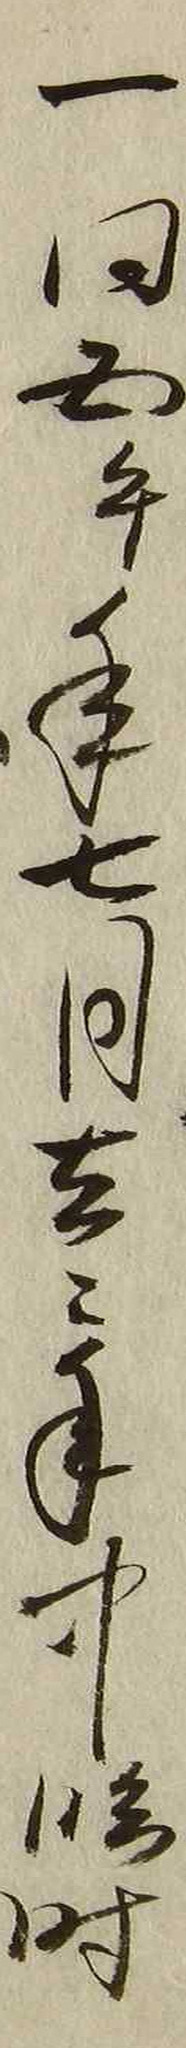一同五午年七月去々年中臨時
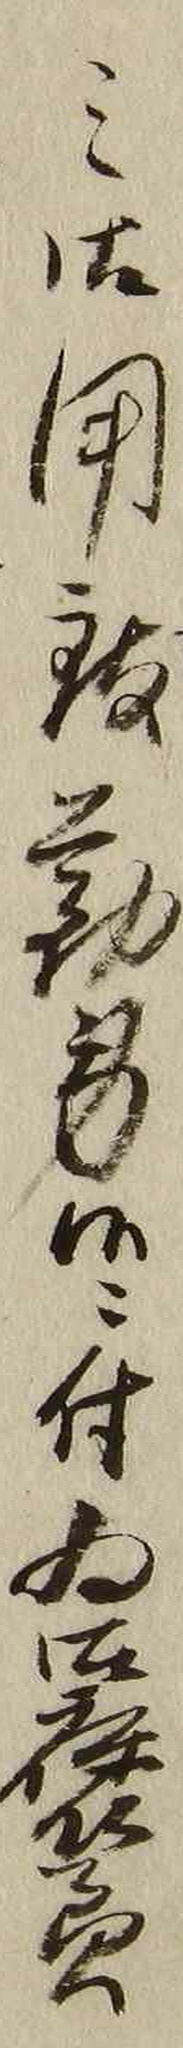之御用致勤身候ニ付為御褒美
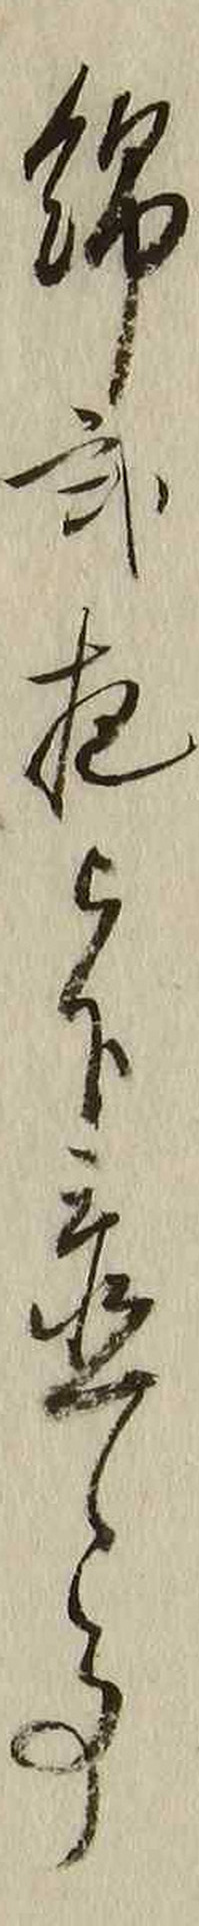綿弐把被下置候事
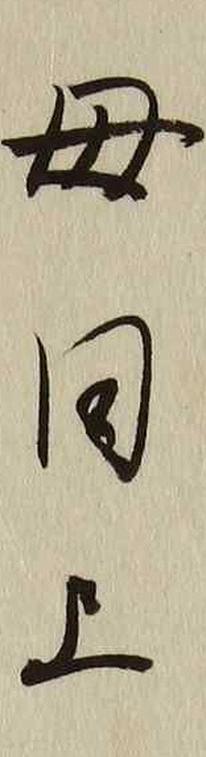母同上
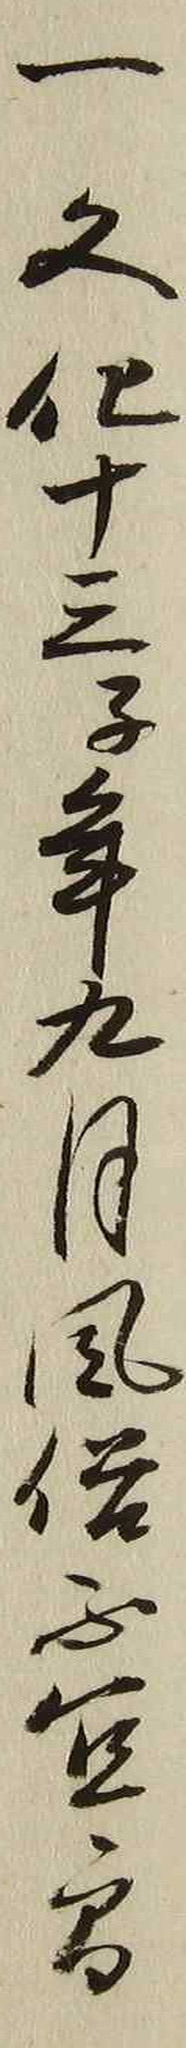一文化十三子年九月風俗不宜候間
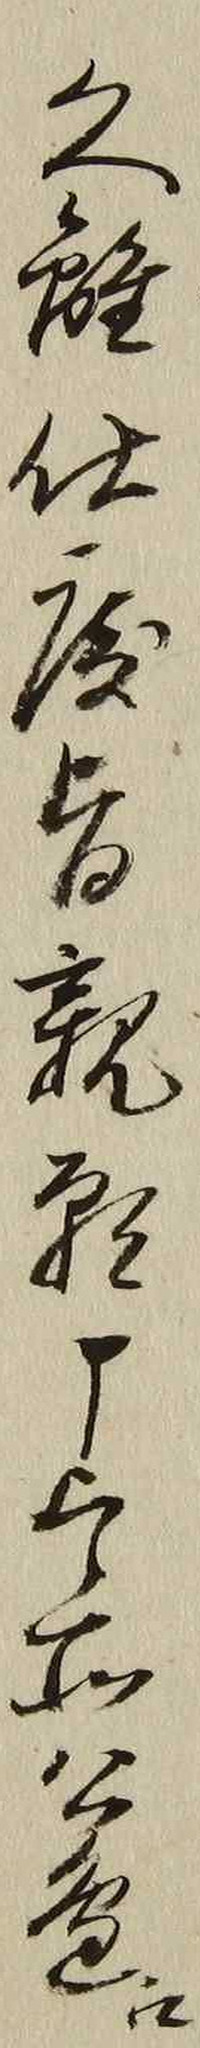久離仕度旨親願申上候所公辺江
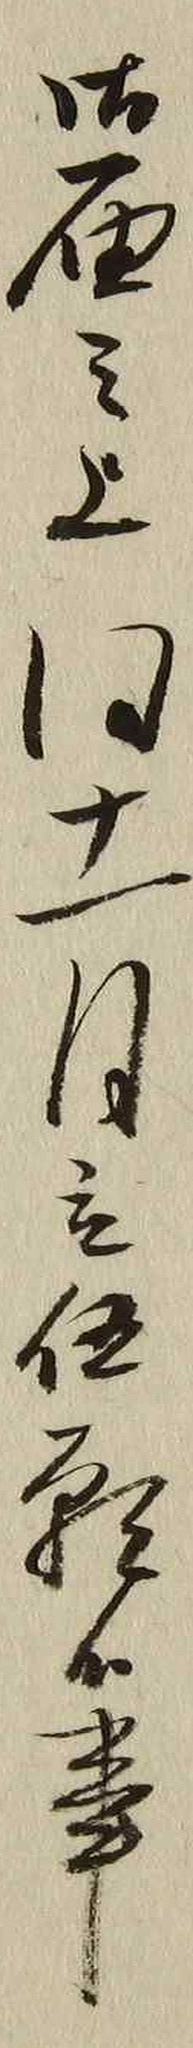御届之上同十一月被任願候事
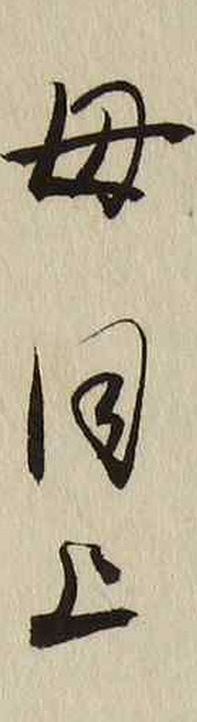母同上
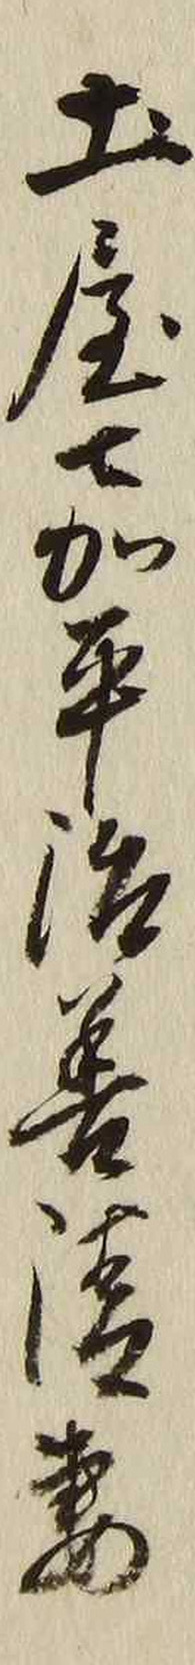女土屋嘉平治善清妻

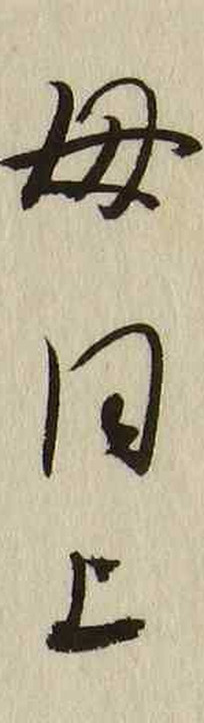母同上
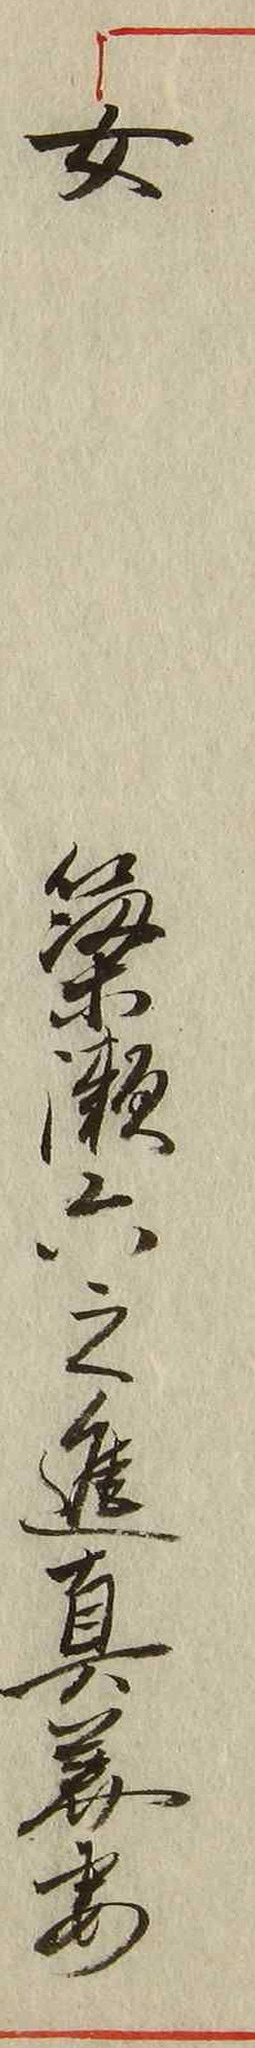女簗瀬六之進真美妻
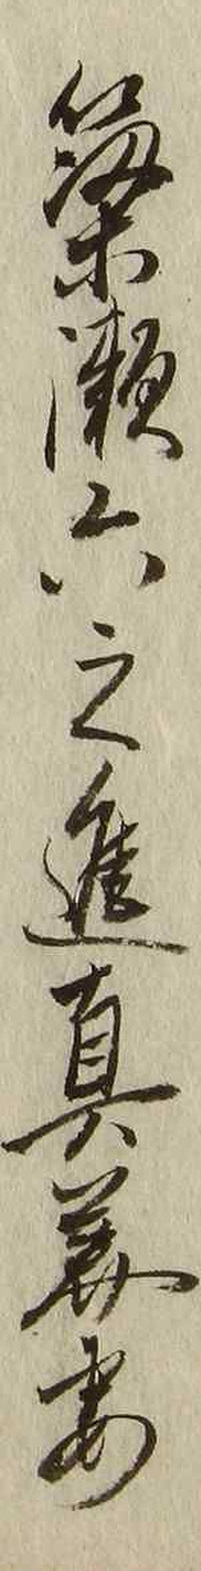女簗瀬六之進真美妻
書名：諸士系譜　巻之352　す之部2
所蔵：会津若松市立会津図書館
